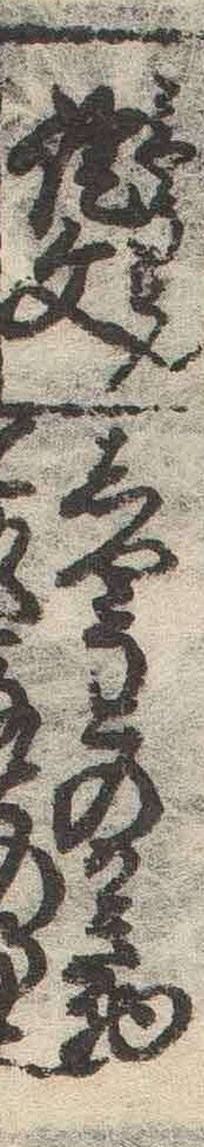證文しやうこのかき物
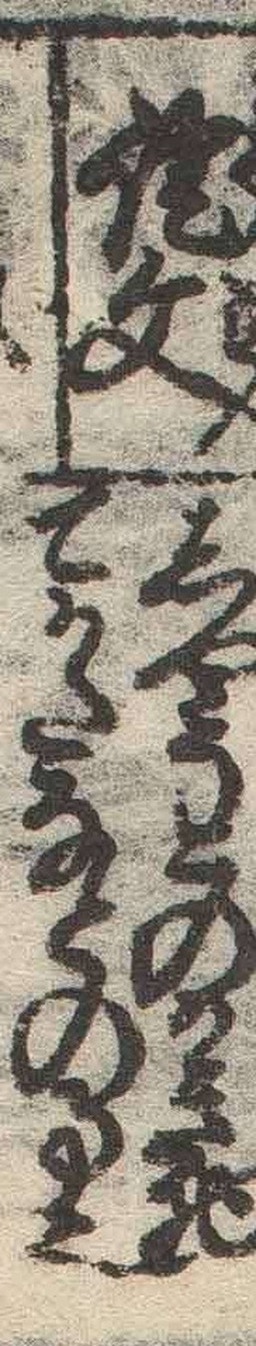てかたなとの事也
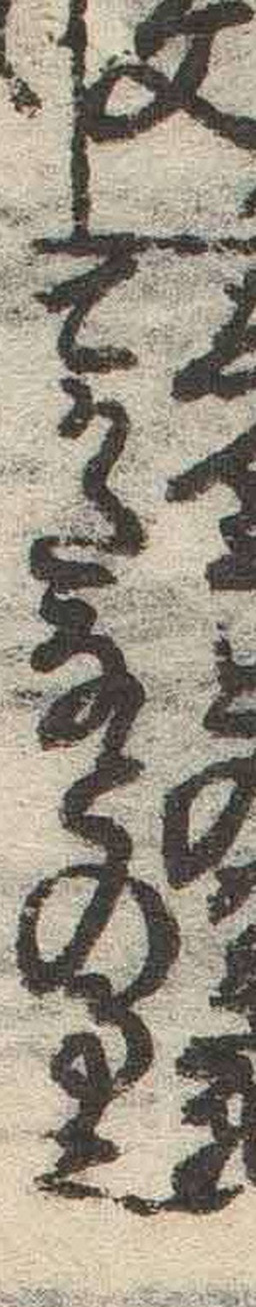てかたなとの事也
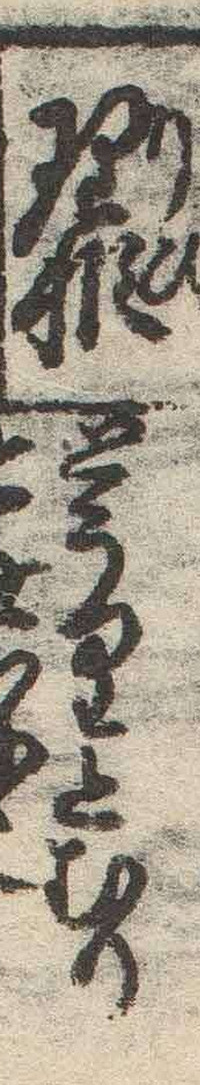理非とうりとむり
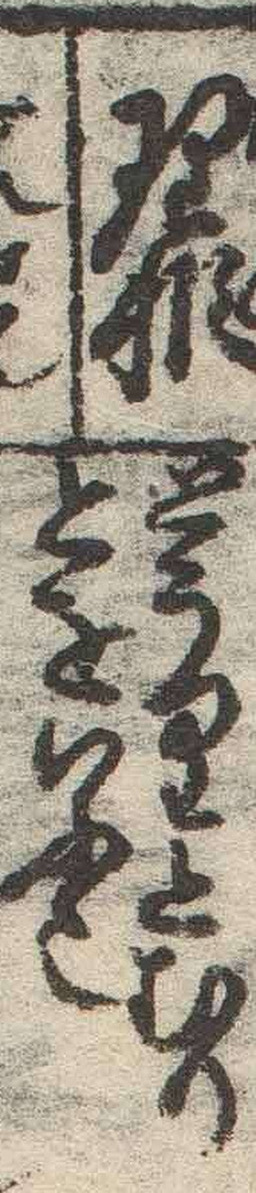とをいふ也
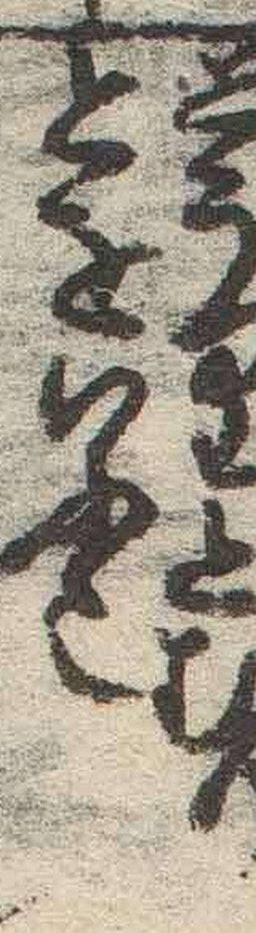とをいふ也
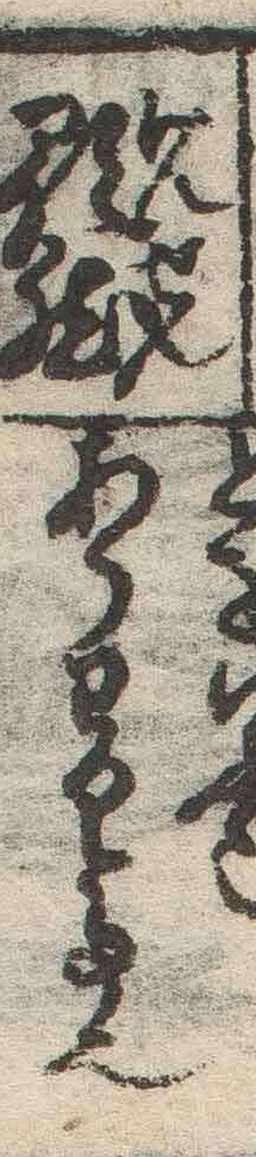顕然あらわるゝ事也
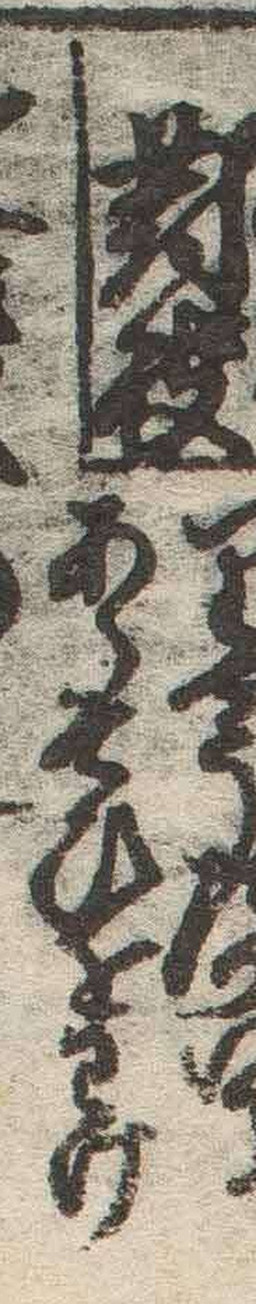あらそこをわけ
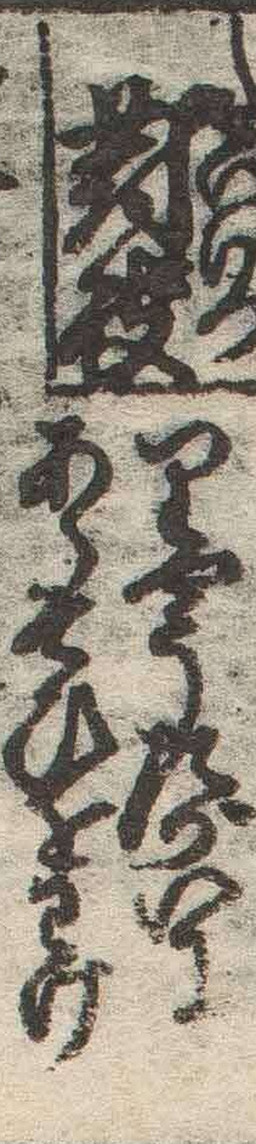あらそこをわけ
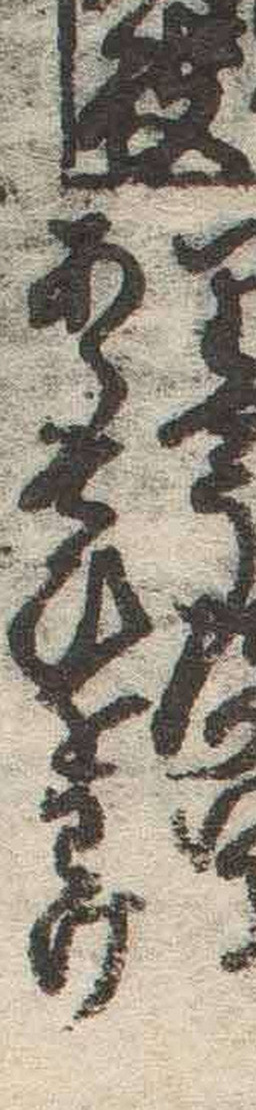あらそこをわけ
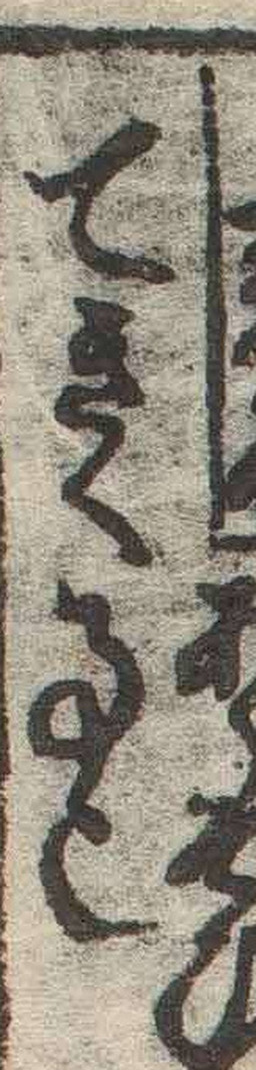てきく事也

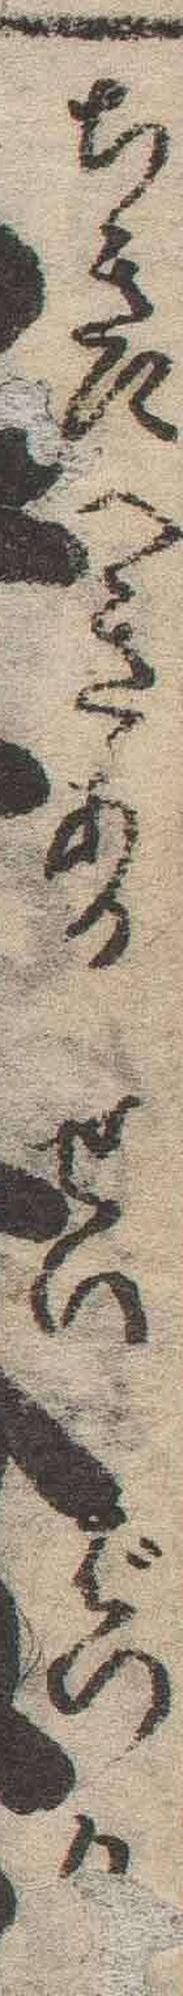ちきにへきあるせいばいか
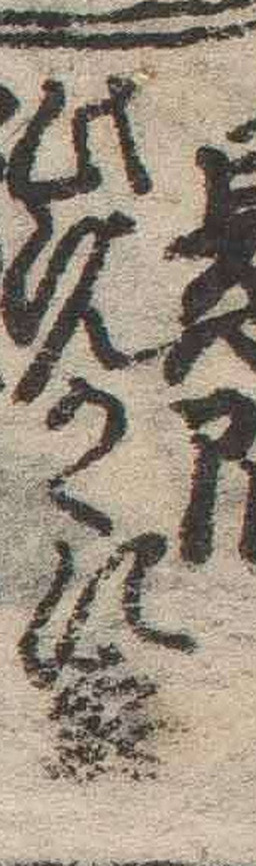此けんかくには
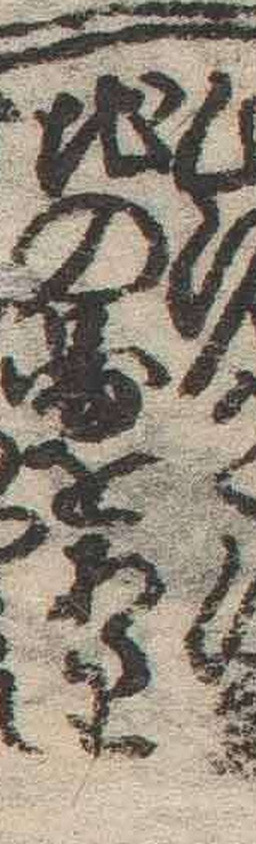地の圖をあらわ
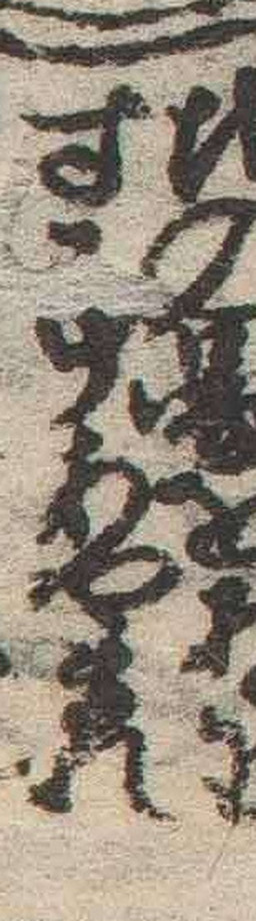す事あやまれ
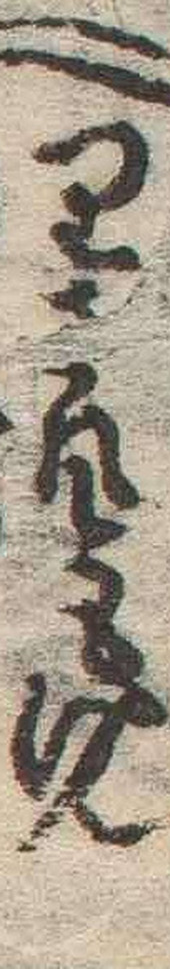りされともけん
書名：御成敗式目絵抄
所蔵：東京学芸大学附属図書館 国文学研究資料館
